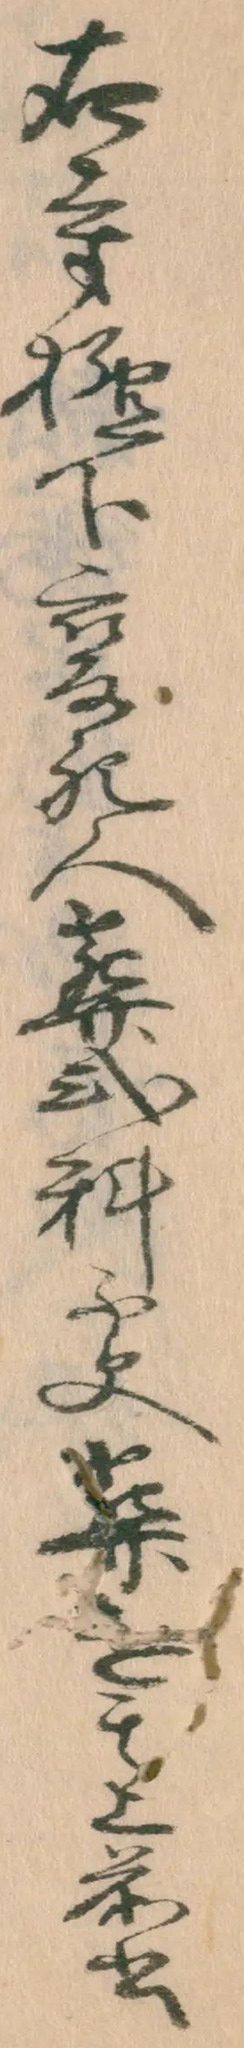右寺檀下変死人葬式料不受葬遣其上前書
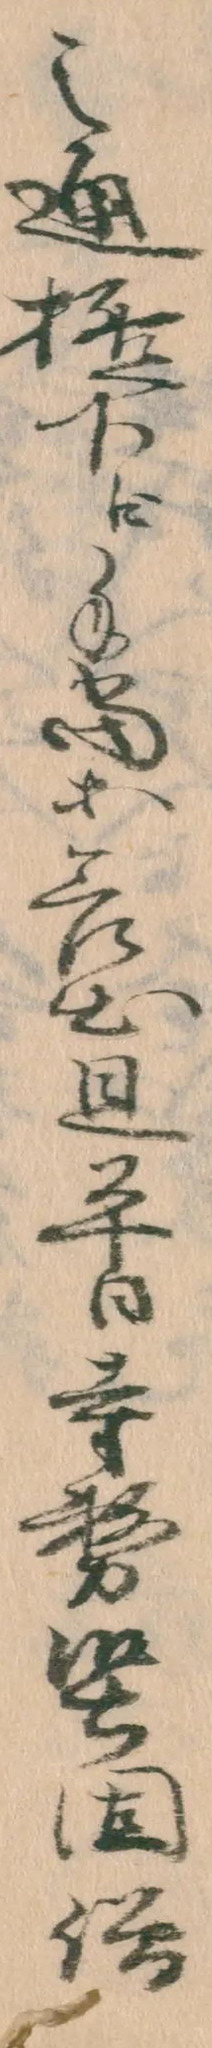之通檀下え手当等差出且平日寺務堅固僧
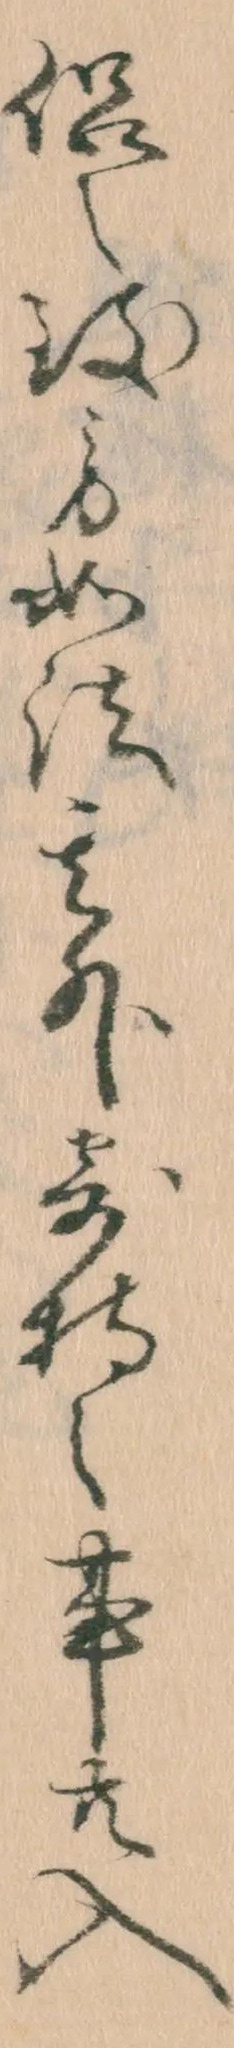侶之致方如法其外奇特之事共入
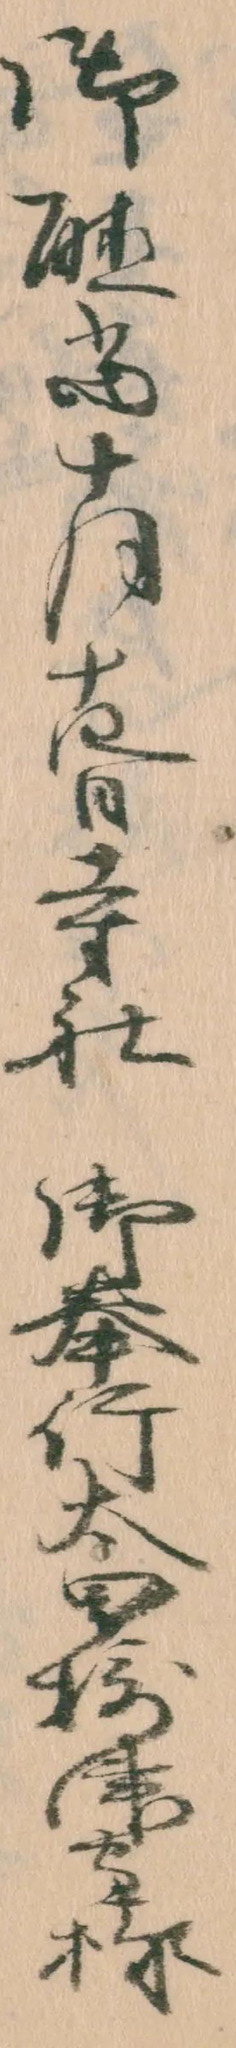御聴当十月十四日寺社御奉行太田摂津守様
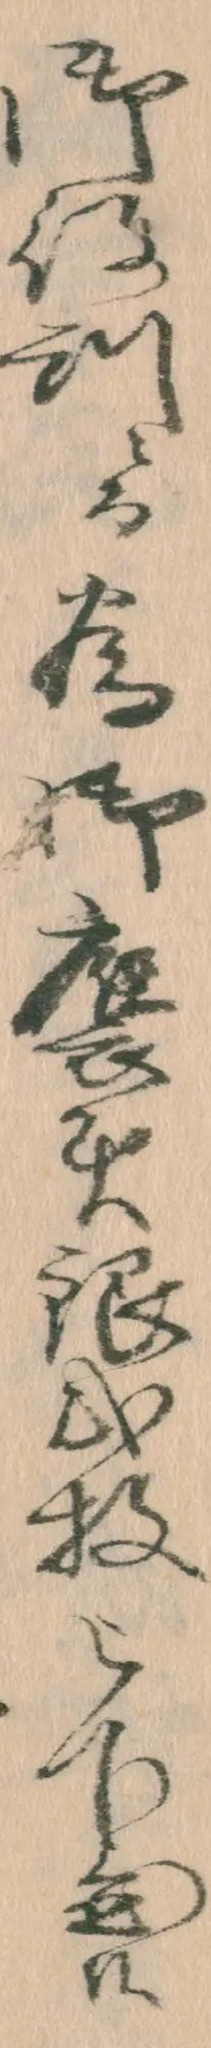御役所ニ而為御褒美銀弐枚被下置候
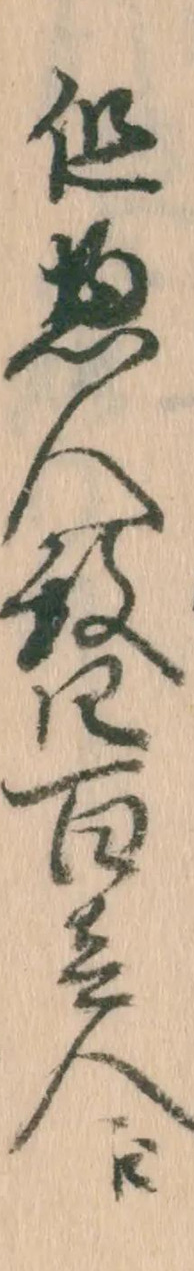但惣人数四百壱人え
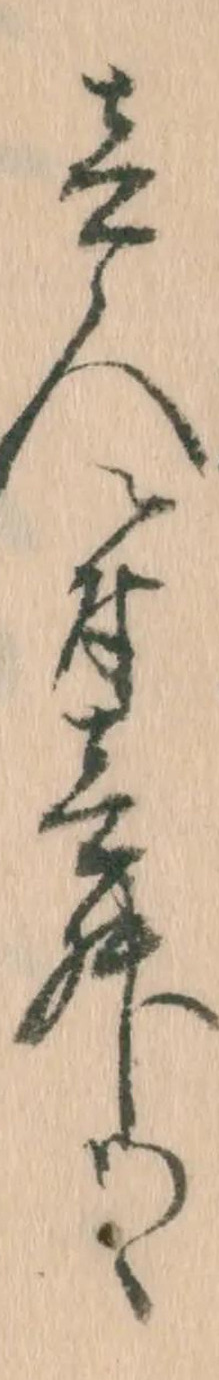壱人ニ付壱升ツヽ
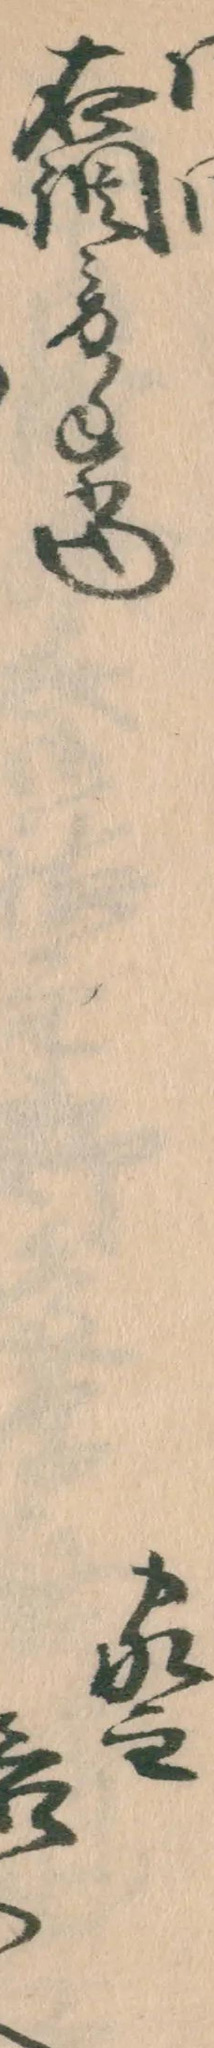右調方手当家主
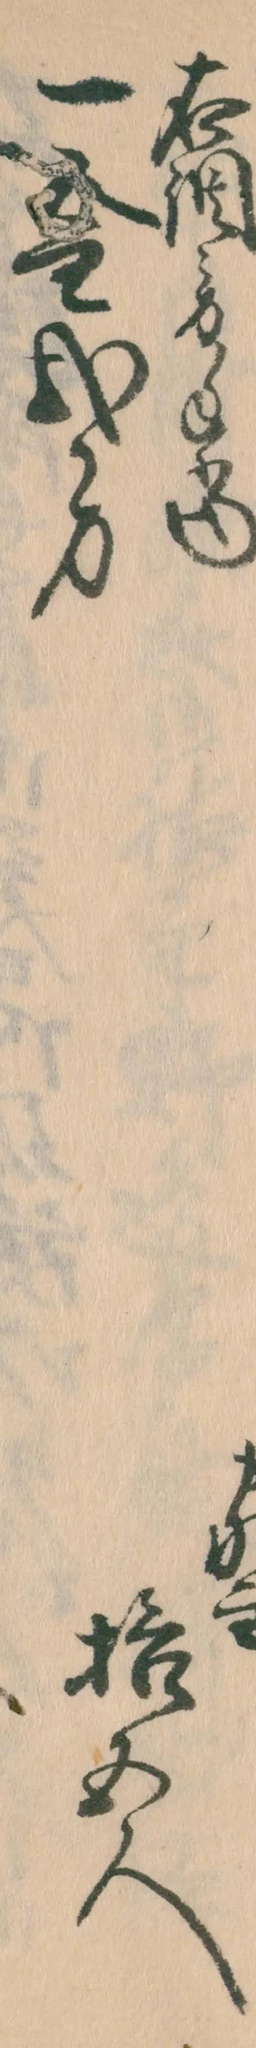一金弐分拾五人

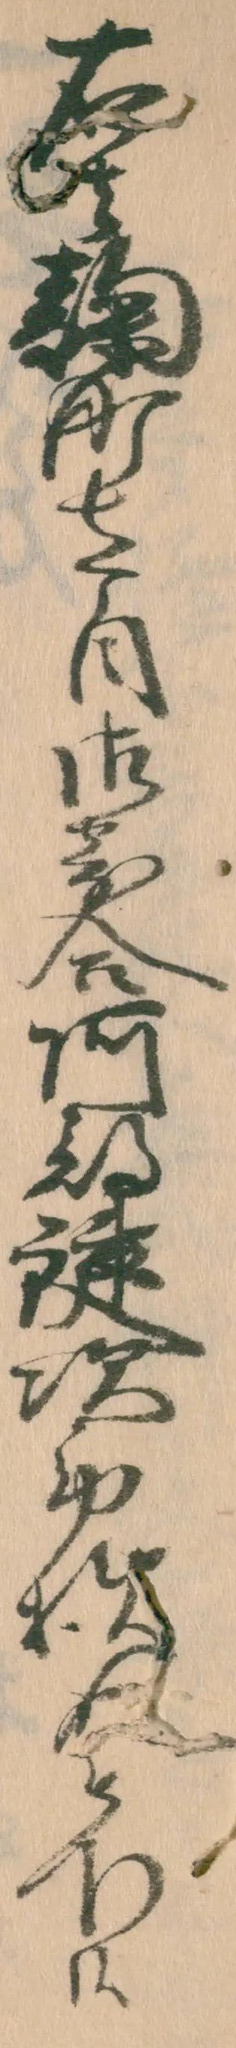右は麹町七丁目御寄合阿部鍵次郎様ゟ被下候
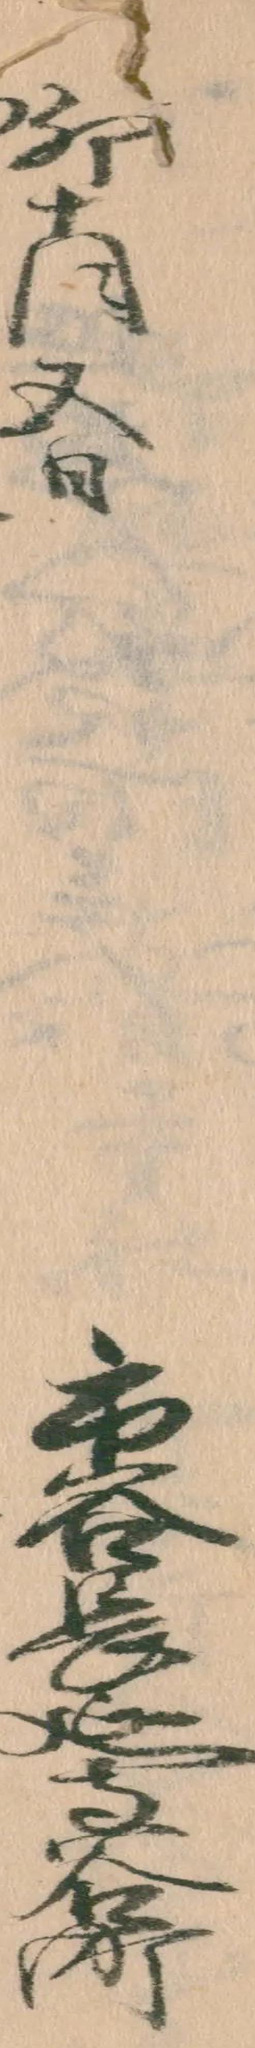卯十月五日市谷長延寺谷町
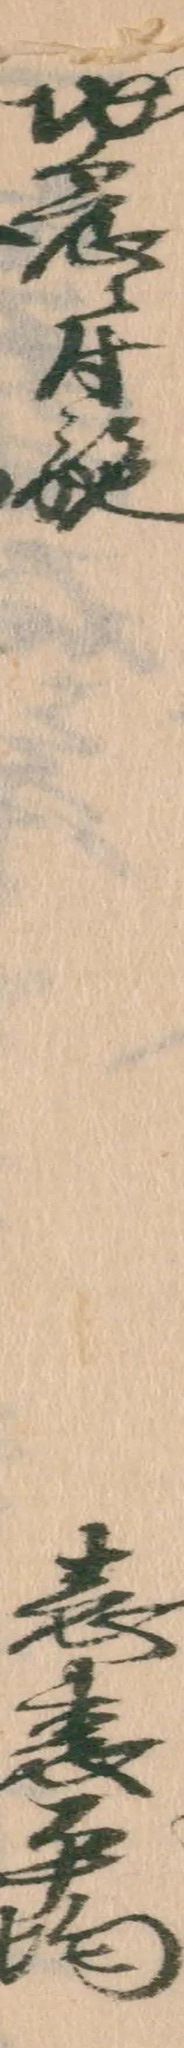地震ニ付施表裏平均
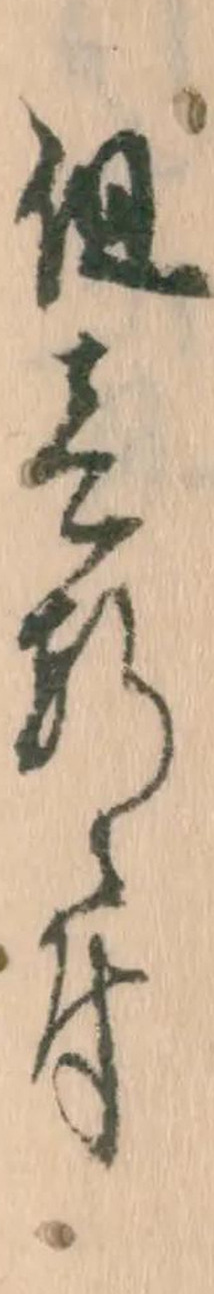但壱軒ニ付
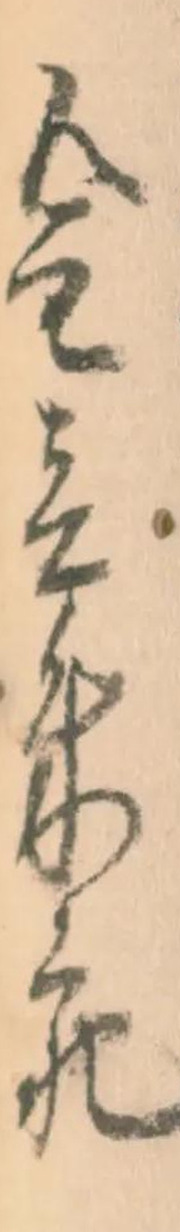金壱朱宛
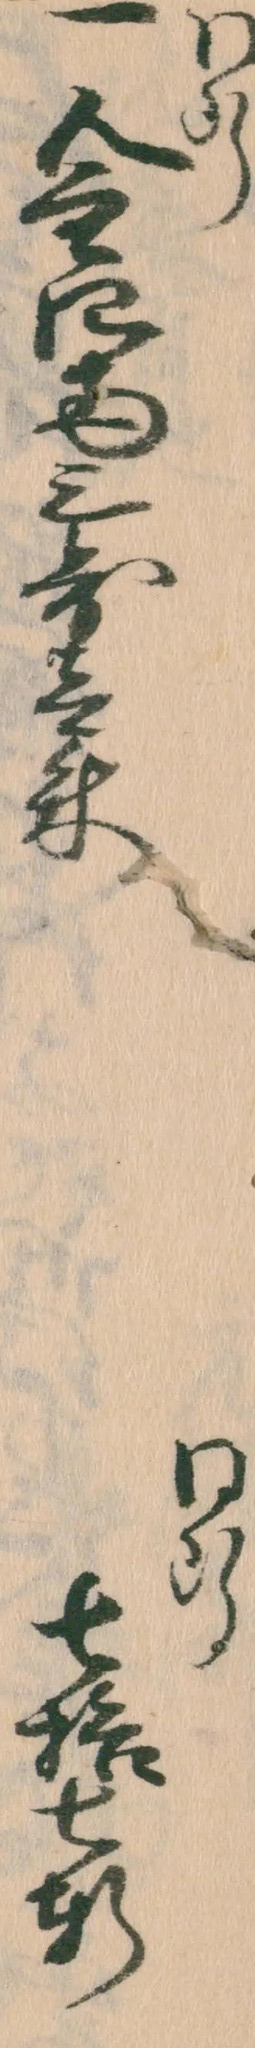一金四両三分壱朱七拾七軒
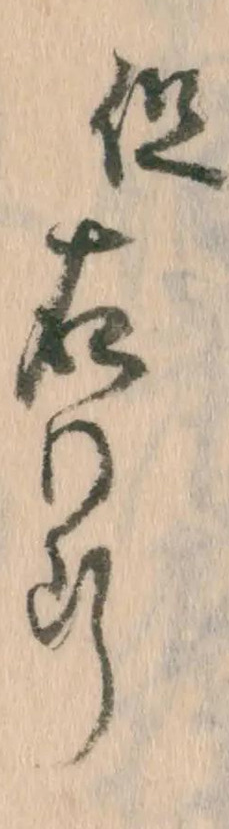但右同断
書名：武家方并寺院等ニテ施差出候一件
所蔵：国立国会図書館 National Diet Library, JAPAN
